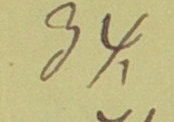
34
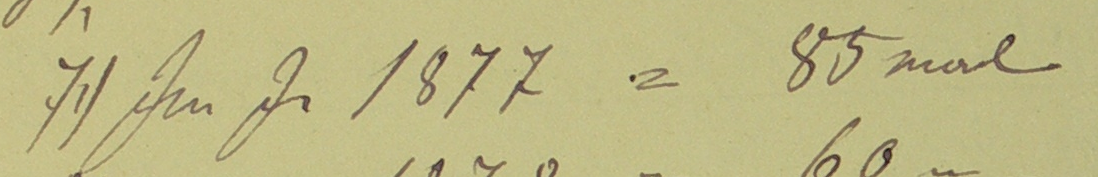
7.) 1877 = 85 mal
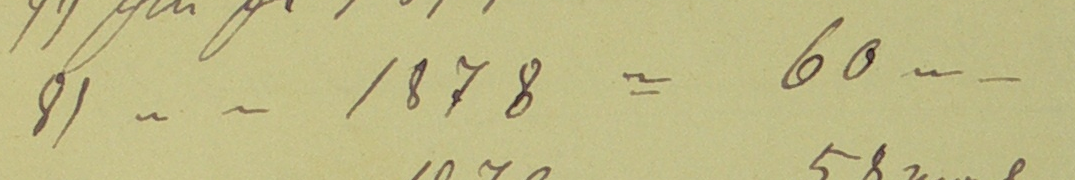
8.) 1878 = 60 mal
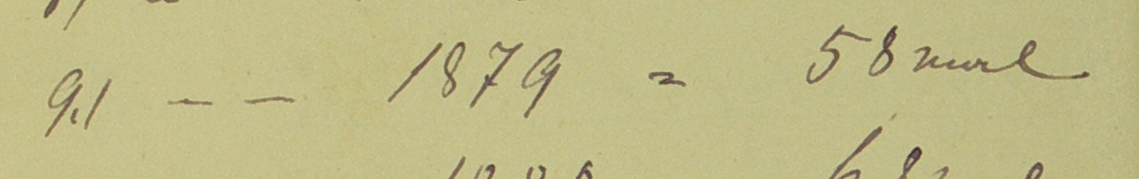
9.) 1879 = 58 mal
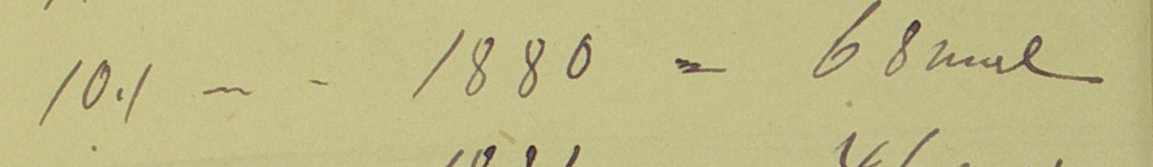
10.) 1880 = 68 mal
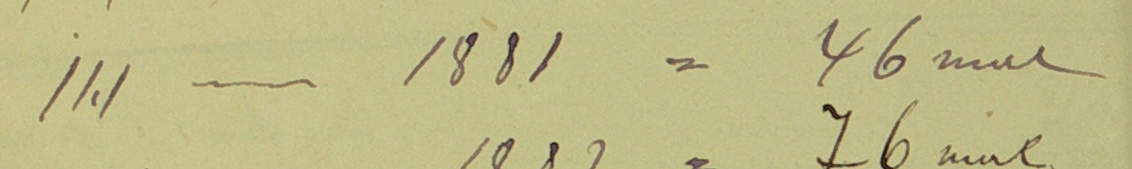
11.) 1881 = 46 mal
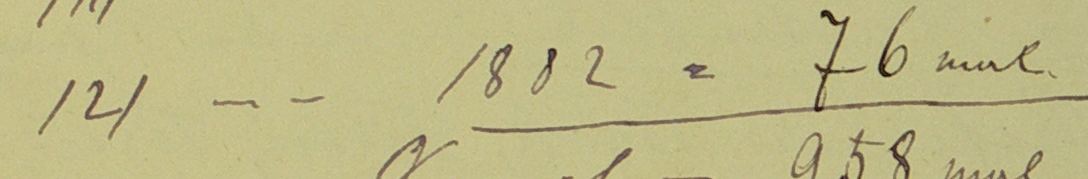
12.) 1882 = 76 mal
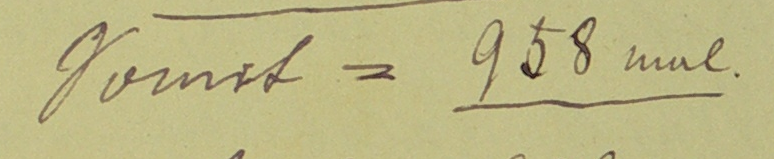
Somit = 958 mal
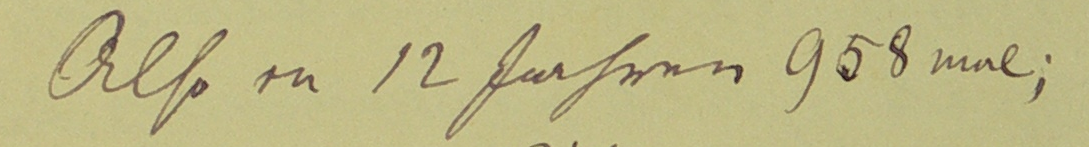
Also in 12 Jahren 958 mal;
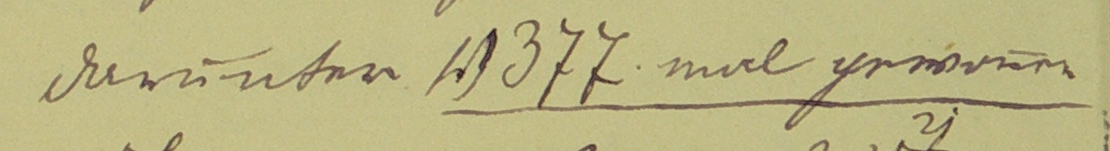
darunter : 1) 377 mal gewonnen;
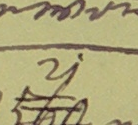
21
